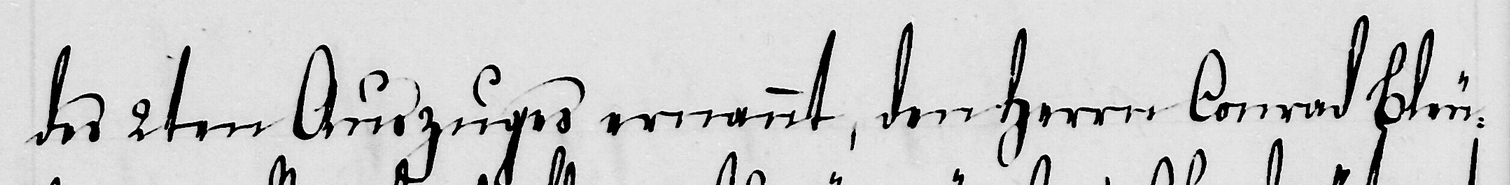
des 2ten Auszuges ernannt, den Herrn Conrad Bleu¬
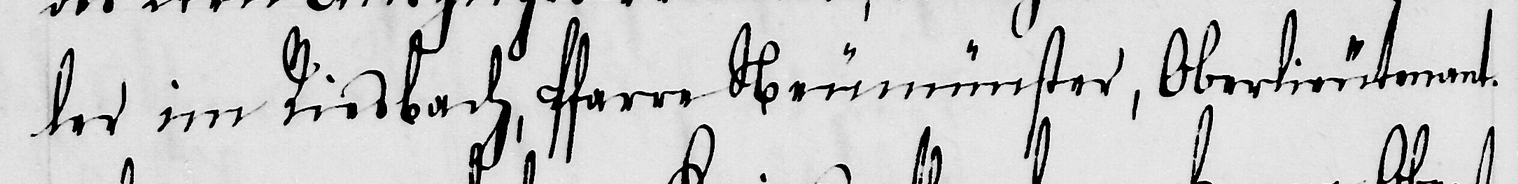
ler im Riesbach, Pfarre Neumünster, Oberlieutenant.
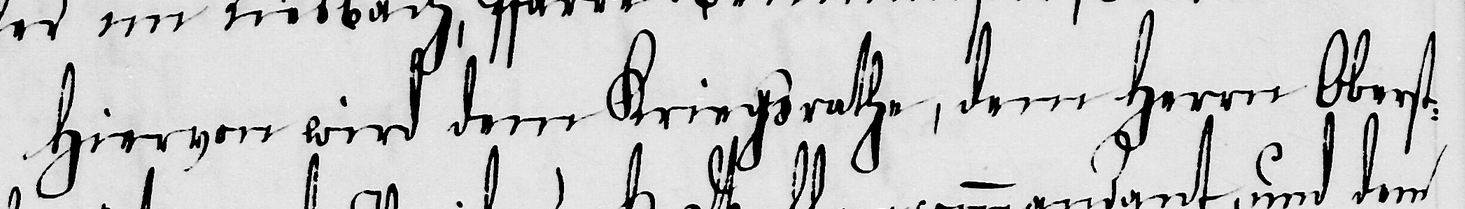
Hiervon wird dem Kriegsrathe, dem Herrn Oberst
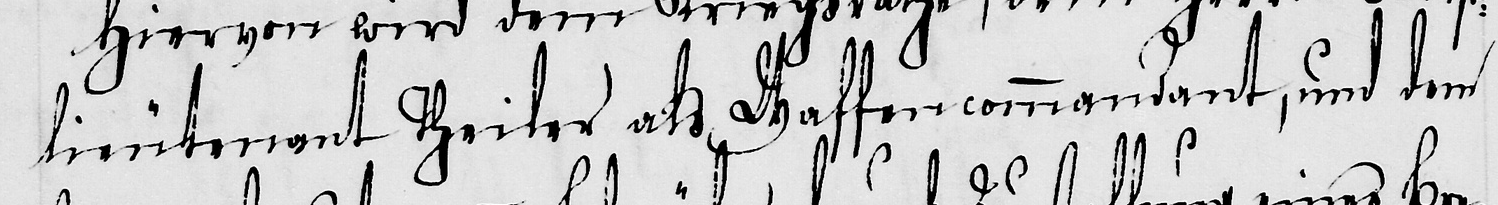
tlieutenant Theiler als Waffencommandant, und dem
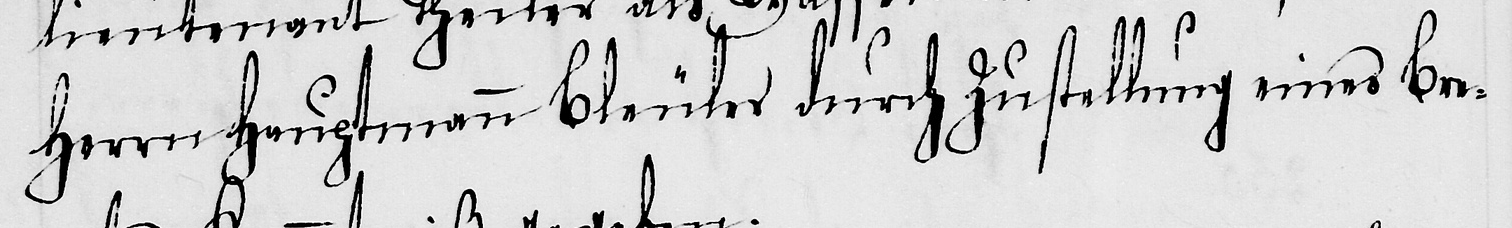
Herrn Hauptmann Bleuler durch Zustellung eines Bre¬
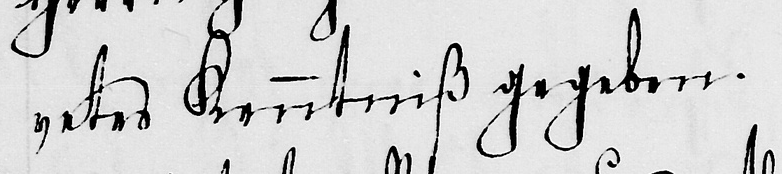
vetes Kenntniß gegeben.
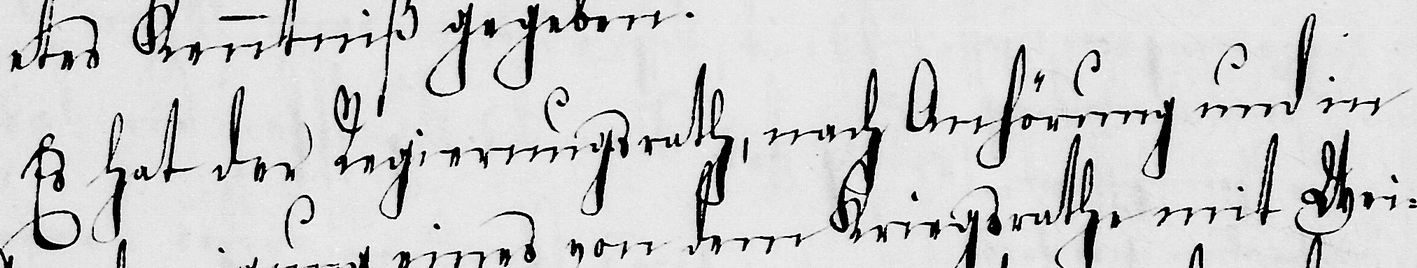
Es hat der Regierungsrath, nach Anhörung und in
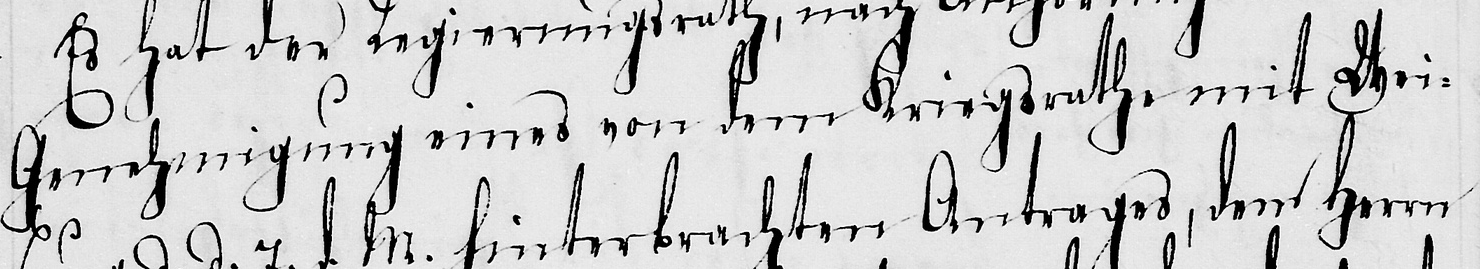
Genehmigung eines von dem Kriegsrathe mit Weis¬
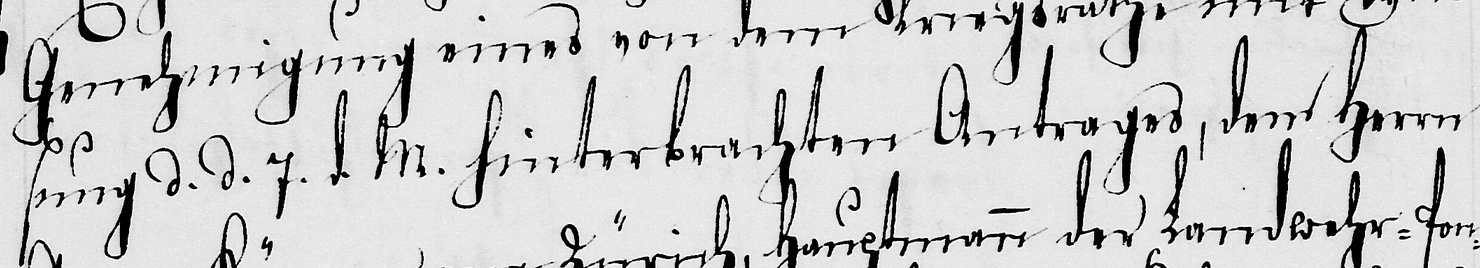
ung d. d. 7. d. M. hinterbrachten Antrages, dem Herrn
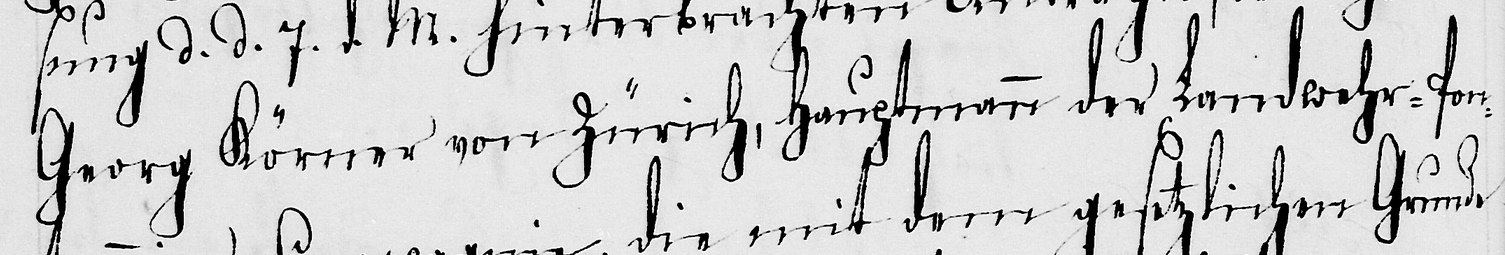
Georg Körner von Zürich, Hauptmann der Landwehr-Pon¬
